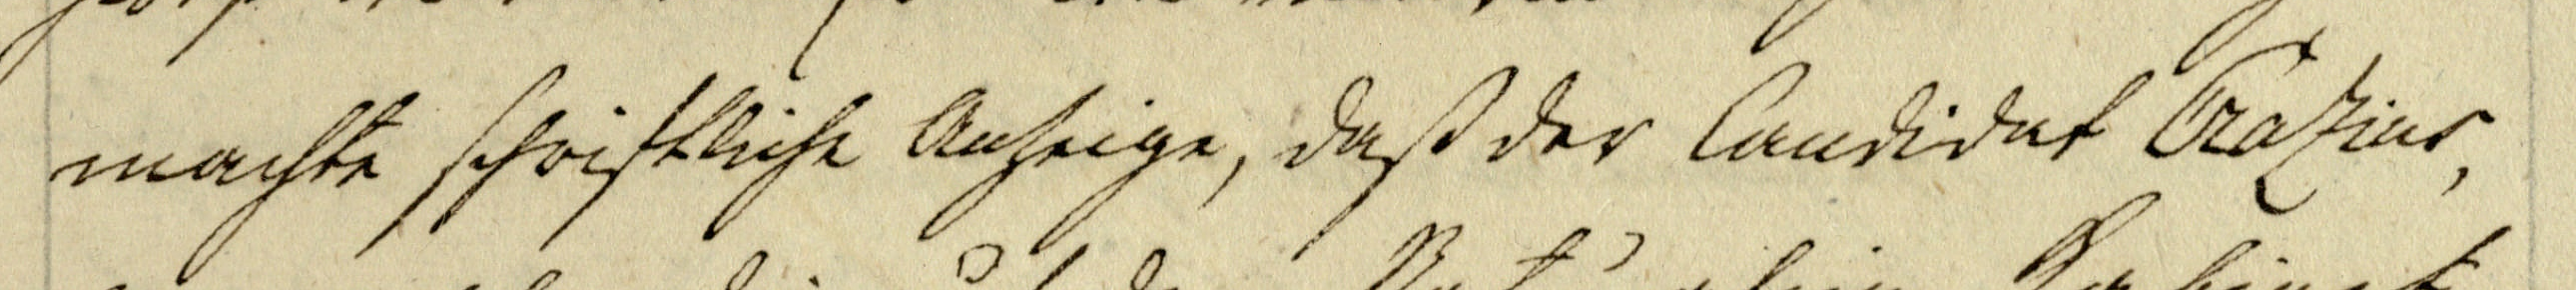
machte schriftliche Anzeige, daß der Candidat Crazius,
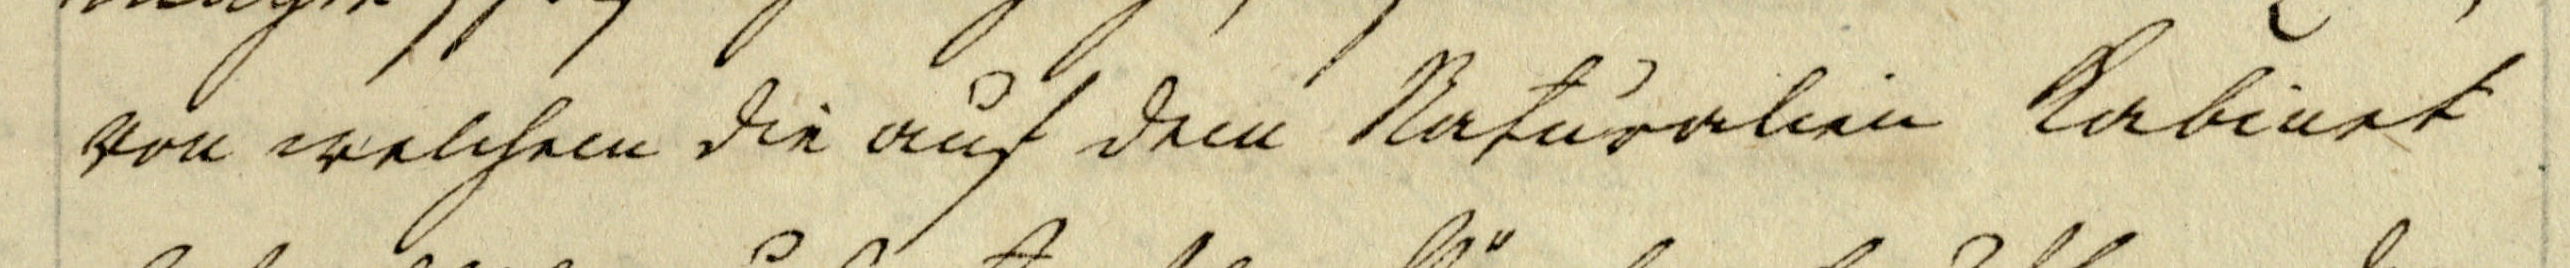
von welchem die auf dem Naturalien Kabinet
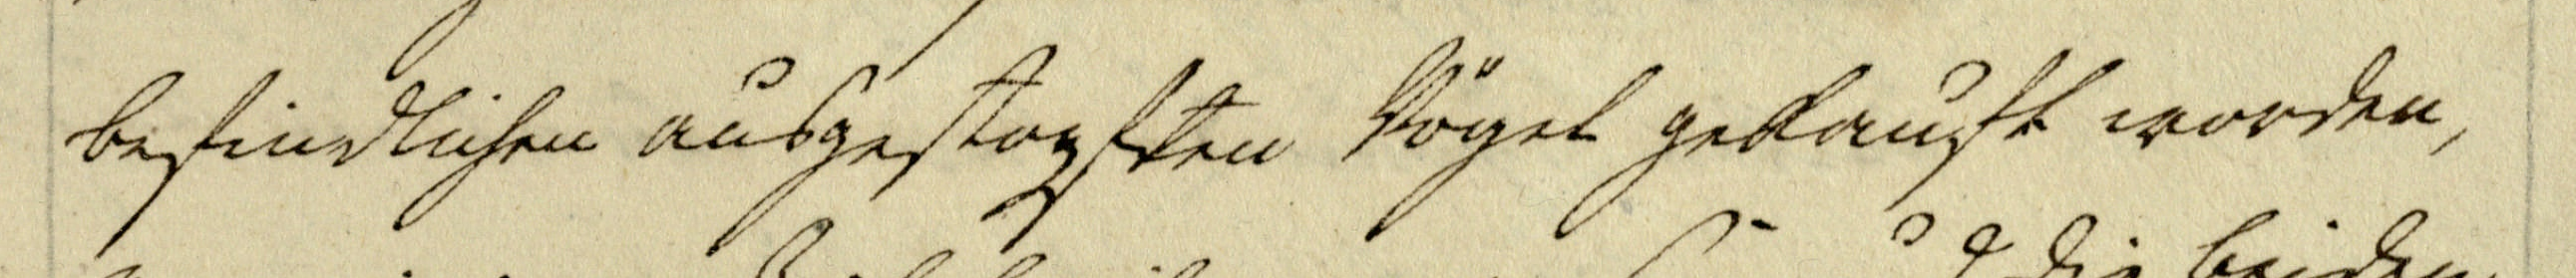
befindlichen ausgestopften Vögel gekauft worden,
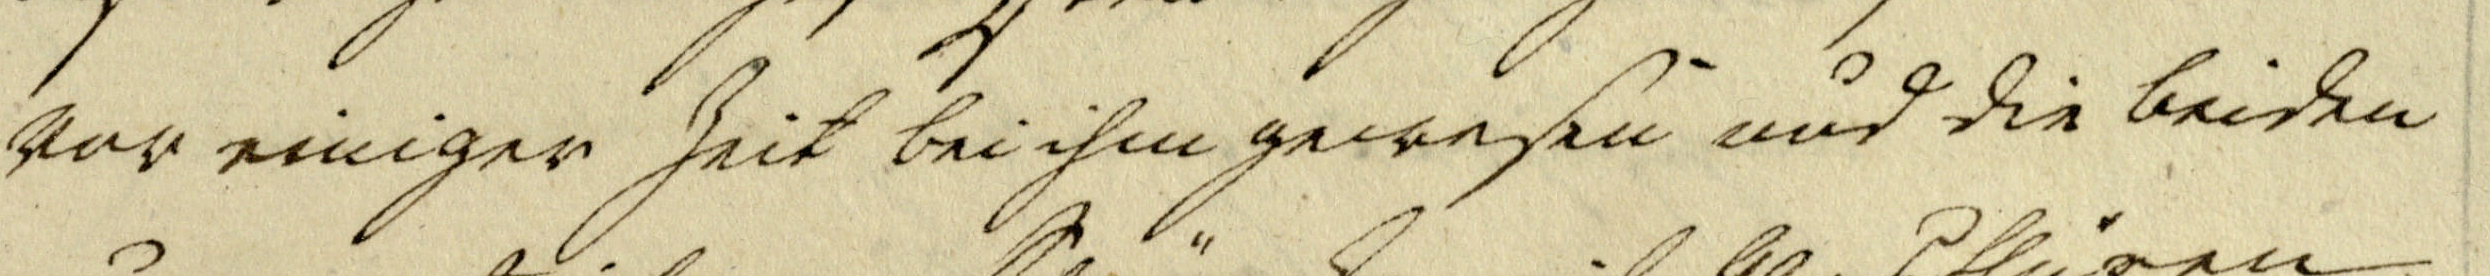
vor einiger Zeit bei ihm gewesen und die beiden
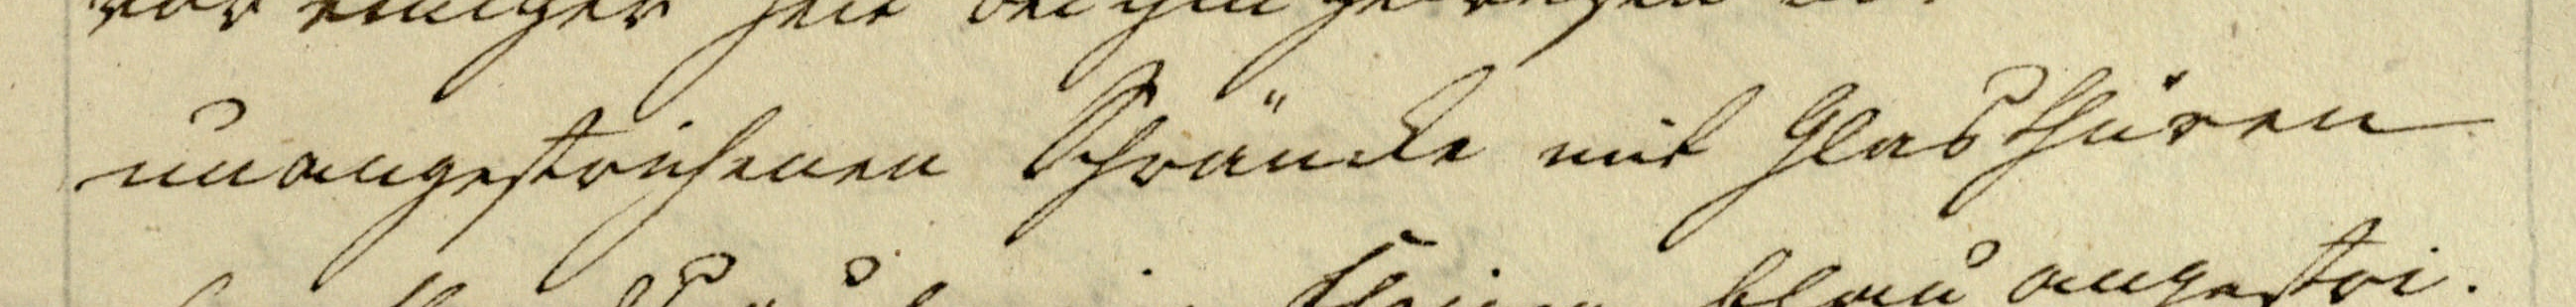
unangestrichenen Schräncke mit Glasthüren
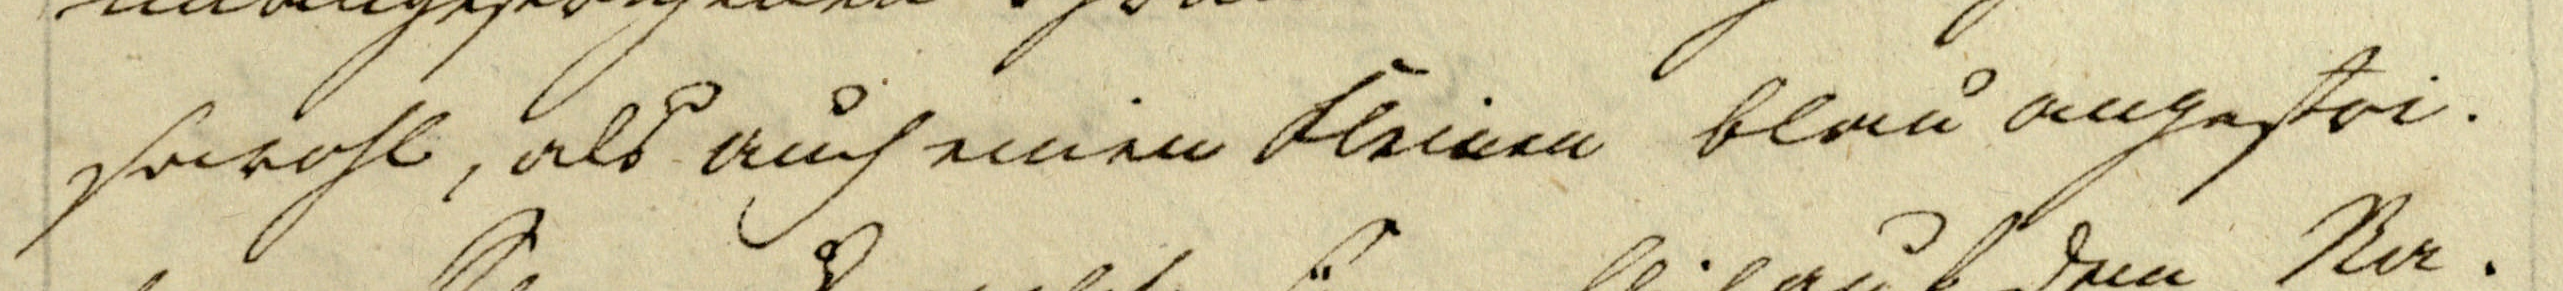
sowohl, als auch einen kleinen blau angestri¬
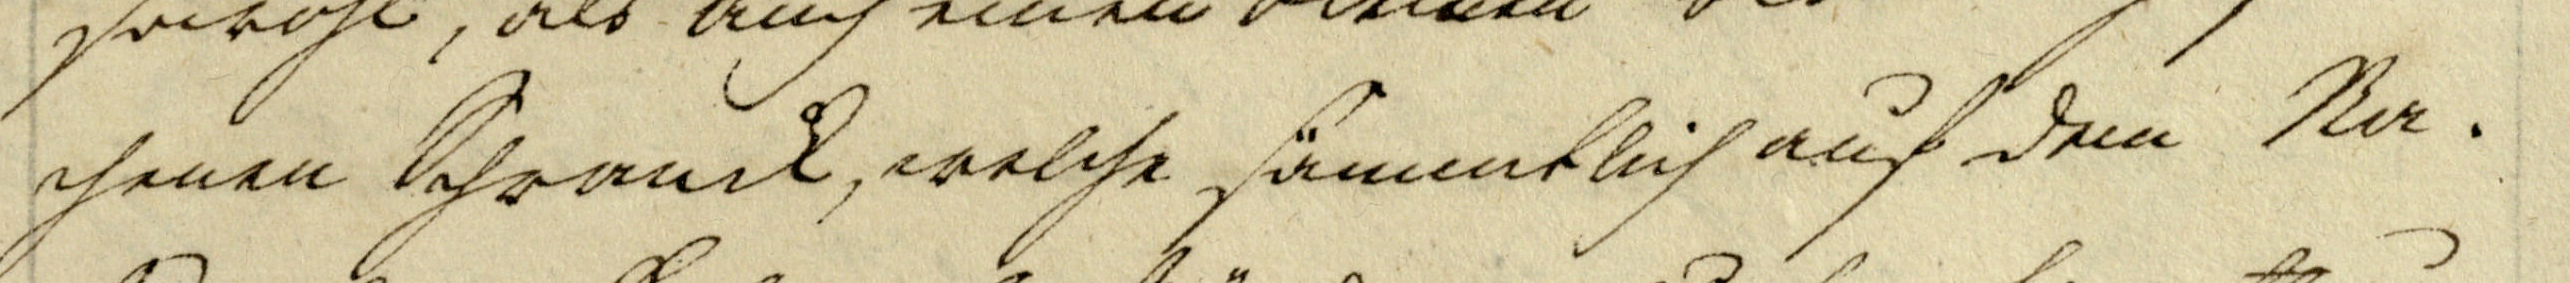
chenen Schranck, welche sämmtlich auf dem Na¬
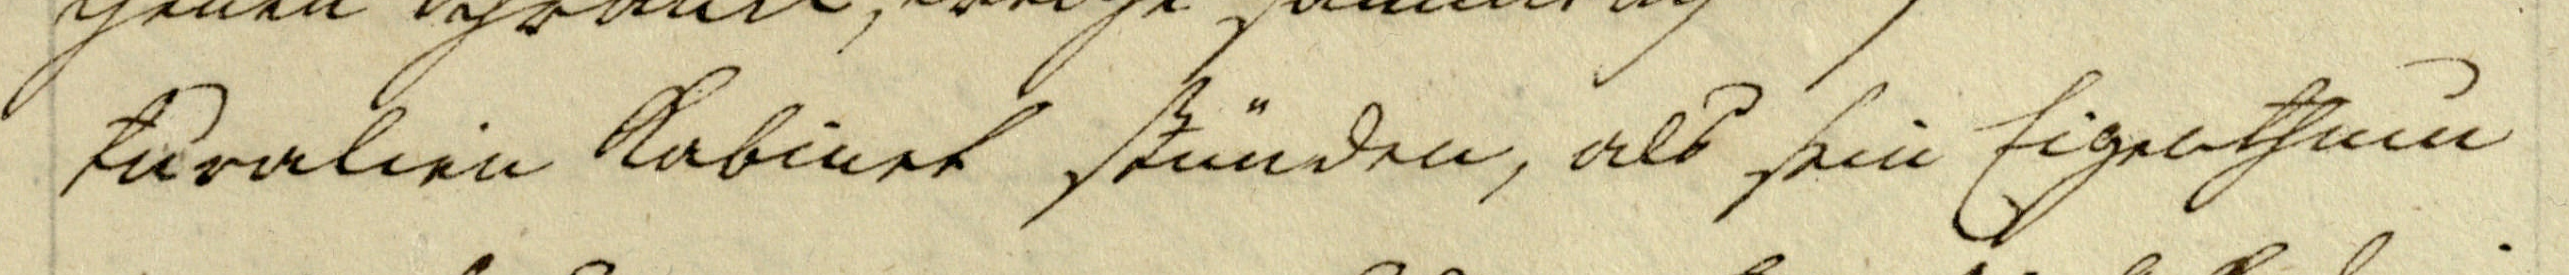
turalien Kabinet stünden, als sein Eigenthum
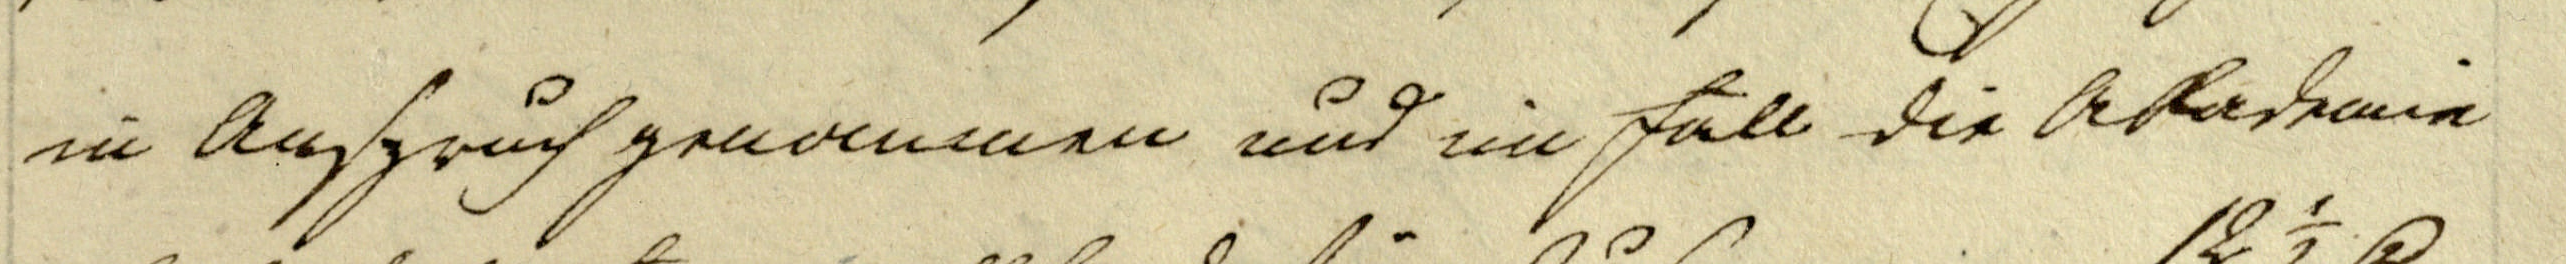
in Anspruch genommen und im Fall die Akademie
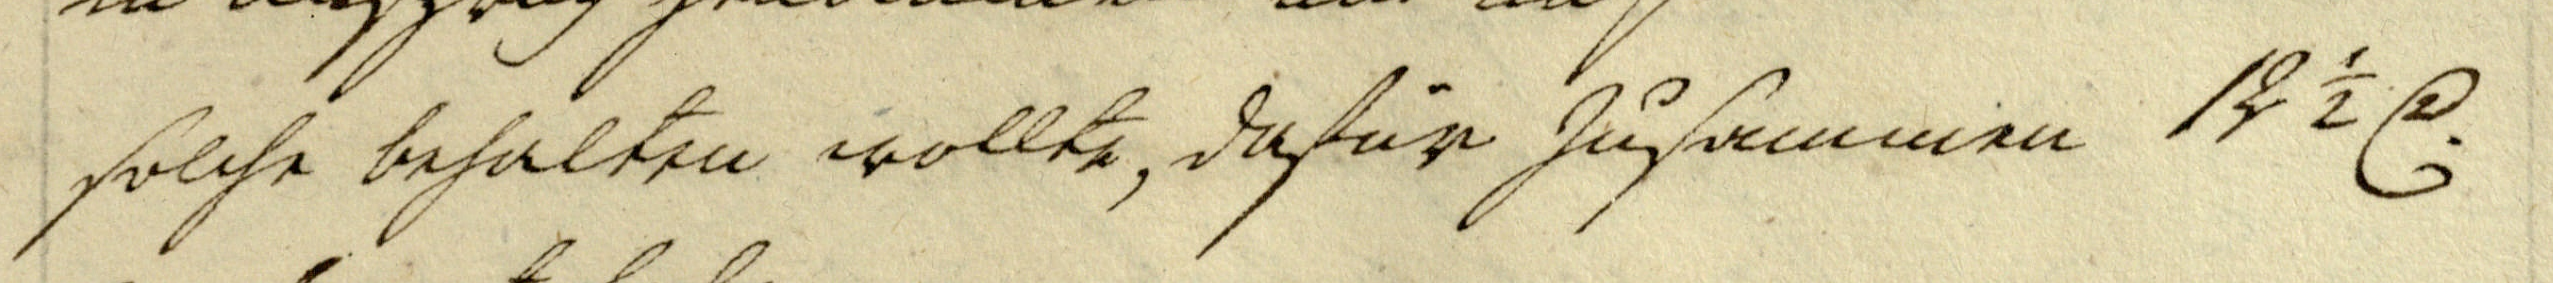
solche behalten wollte, dafür zusammen 12 ½ l.
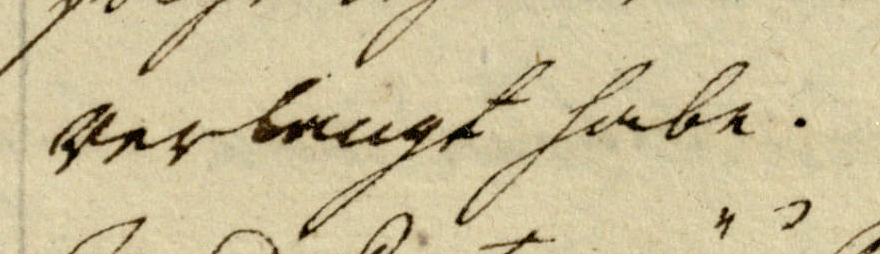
verlangt habe.
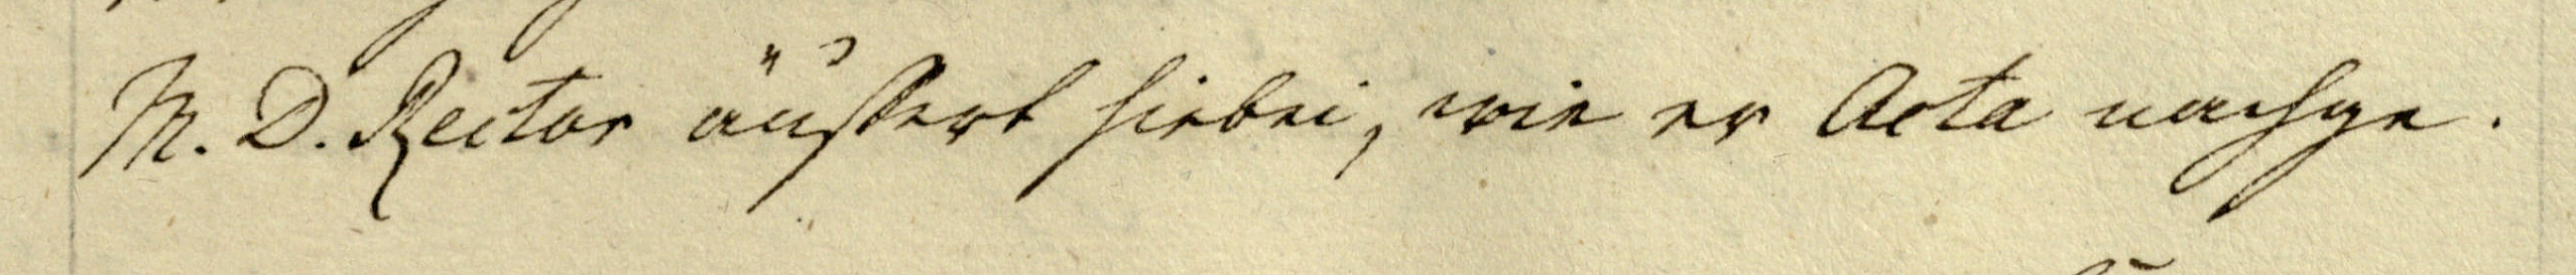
M. D. Rector äussert hiebei, wie er Acta nachge¬
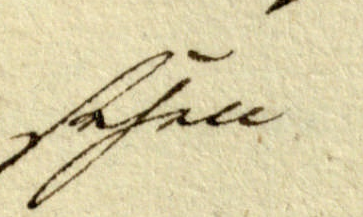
sehen
